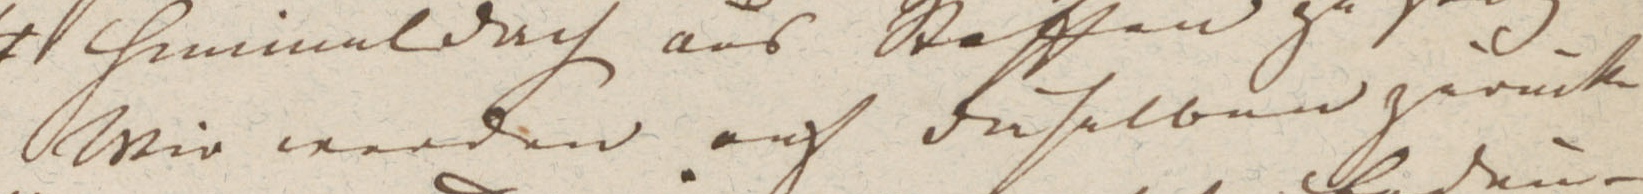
Wir werden auf dieselben zurück-
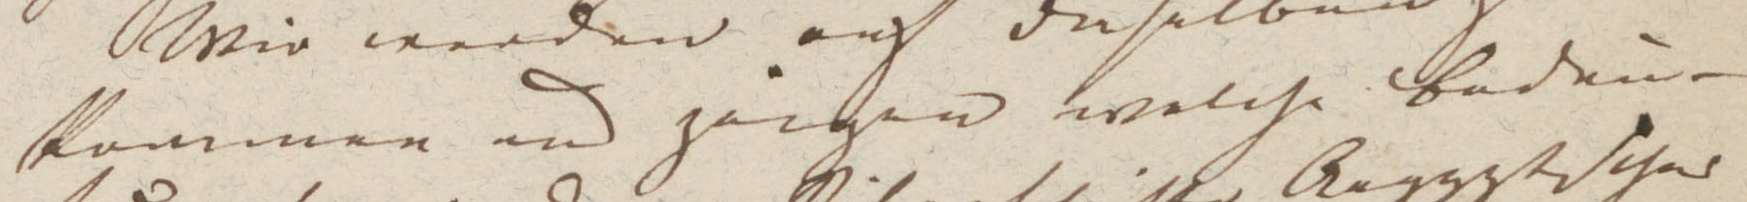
kommen und zeigen welche Bedeu-
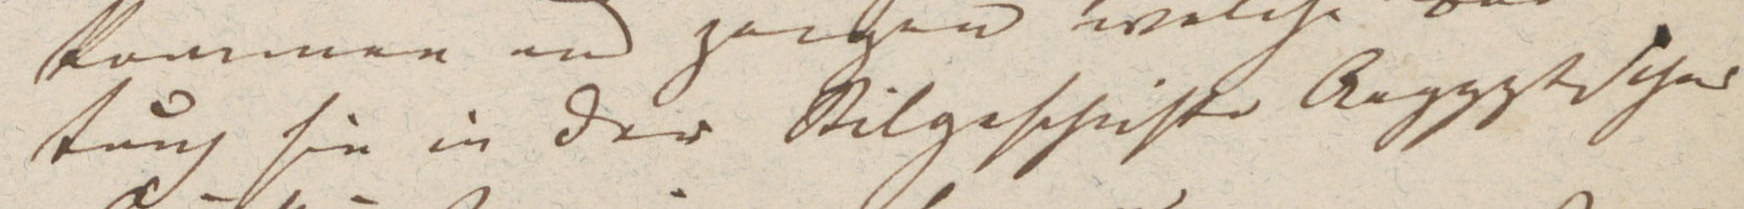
tung sie in der Stilgeschichte Aegyptischer
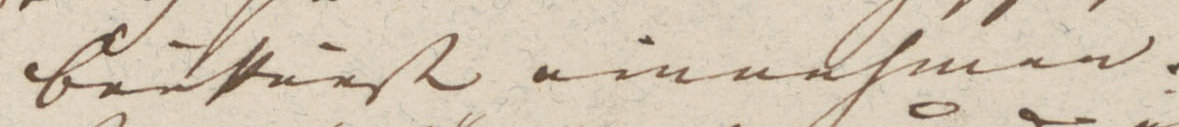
Baukunst einnehmen.
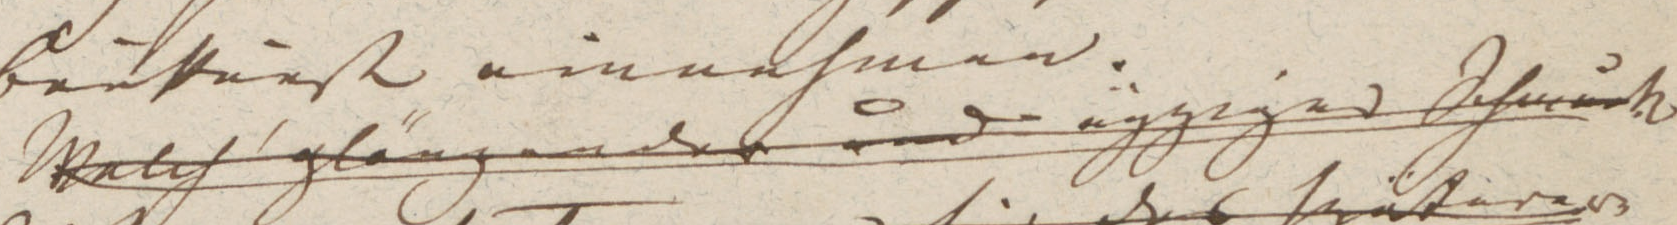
Welch' glänzender und üppiger Schmuck
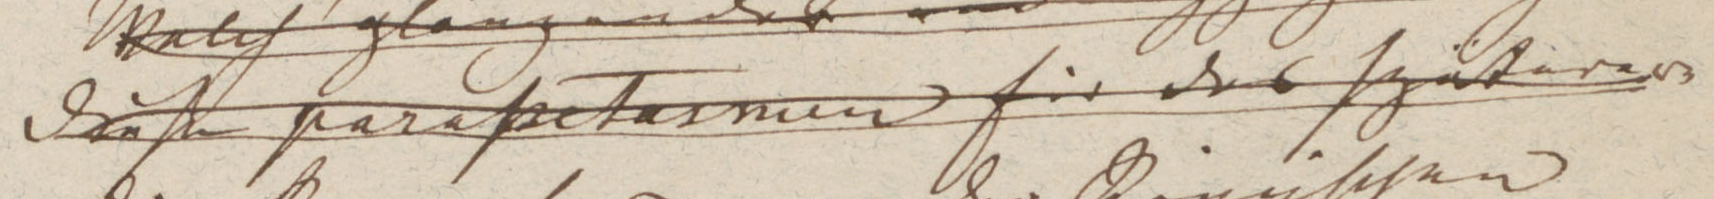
diese parapetasmen für das spätere
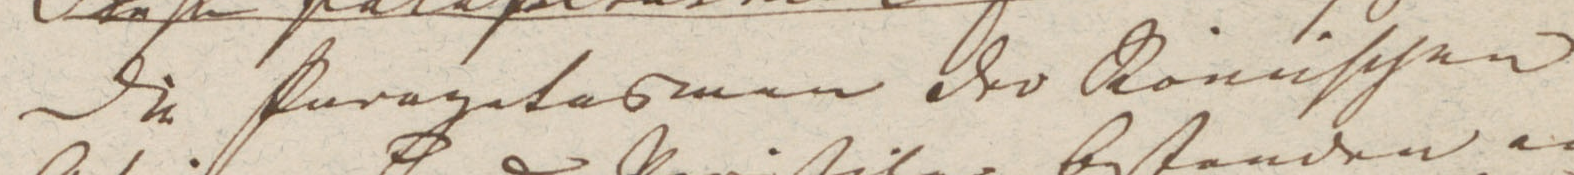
Die Parapetasmen der Römischen
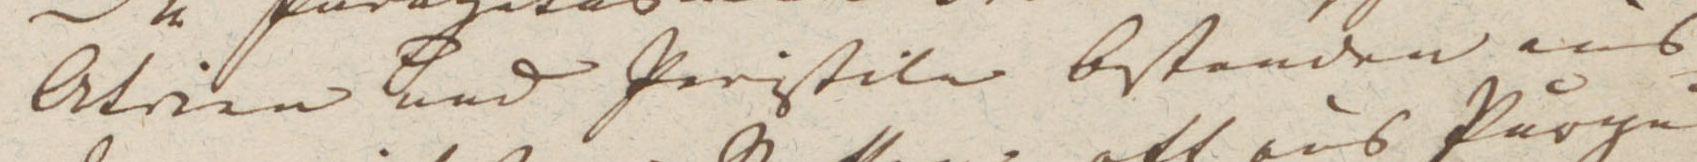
Atrien und Peristile bestanden aus
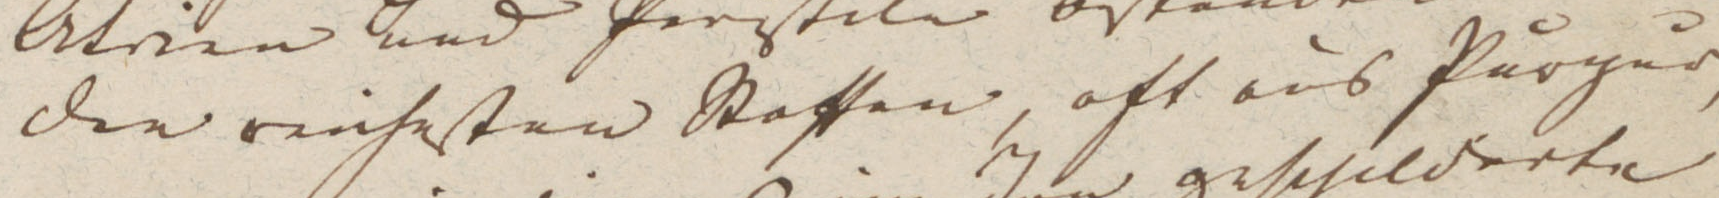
den reichsten Stoffen, oft aus Purpur,
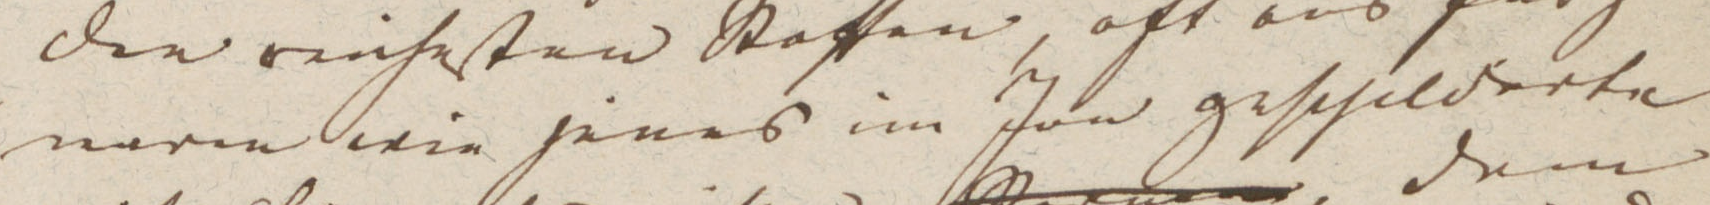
waren wie jenes im Jon geschilderte
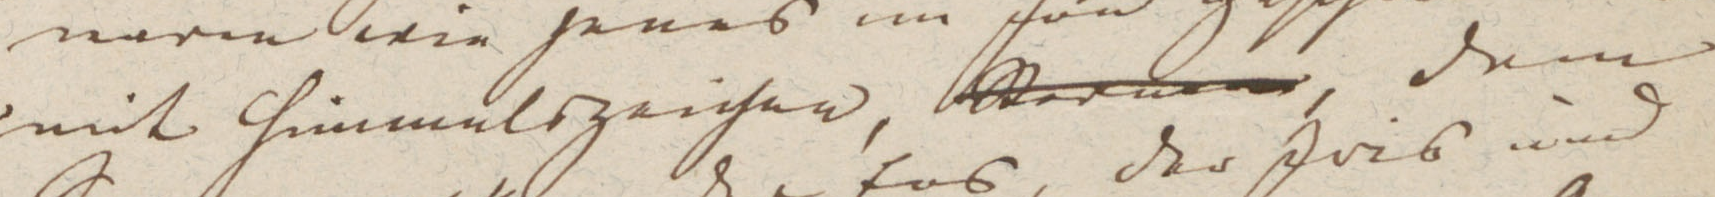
mit Himmelszeichen, Sternen, dem
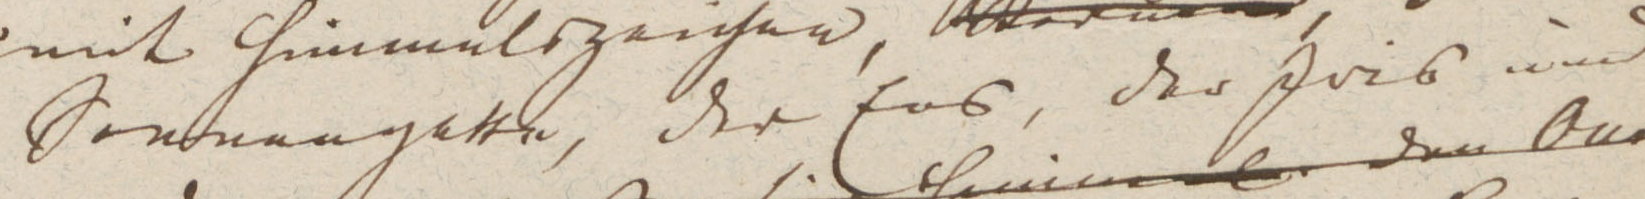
Sonnengotte, der Eos, der Iris und
